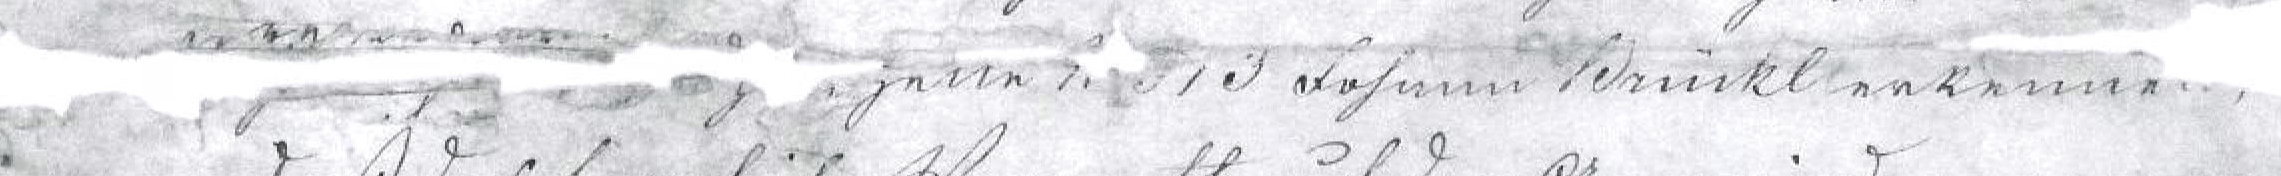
zelle№ 373 Johann Brückl erkennen
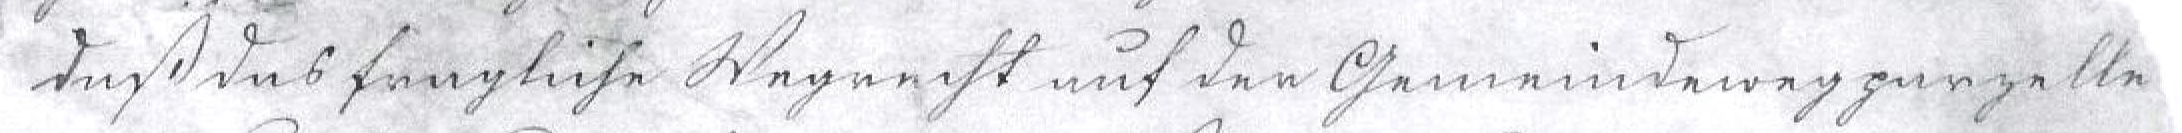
daß das fragliche Wegrecht auf der Gemeindewegparzelle
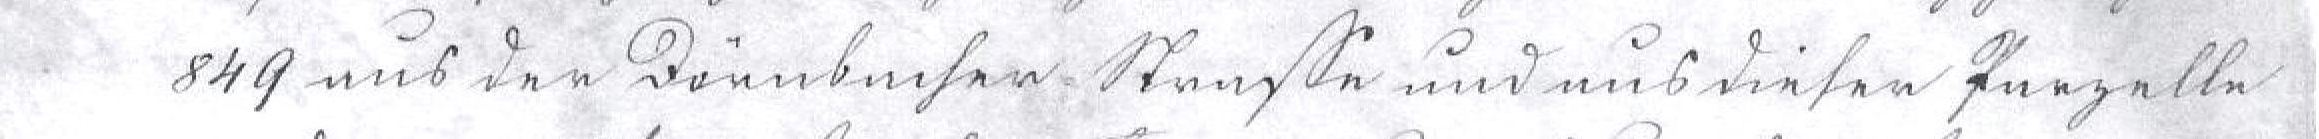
849 aus der Dörnbacher Strasse und aus dieser Parzelle
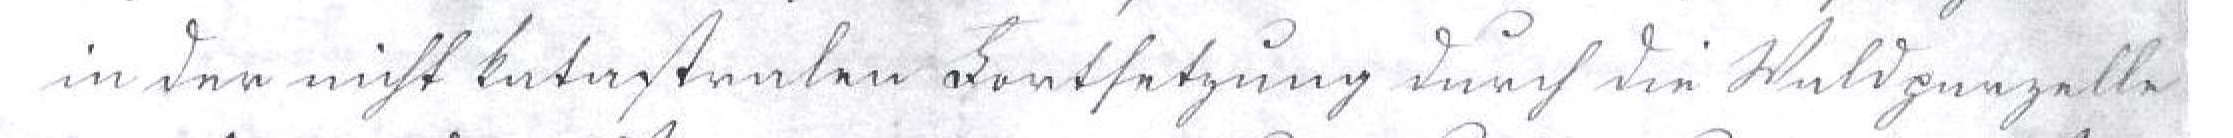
in der nicht katastralen Fortsetzung durch die Waldparzelle
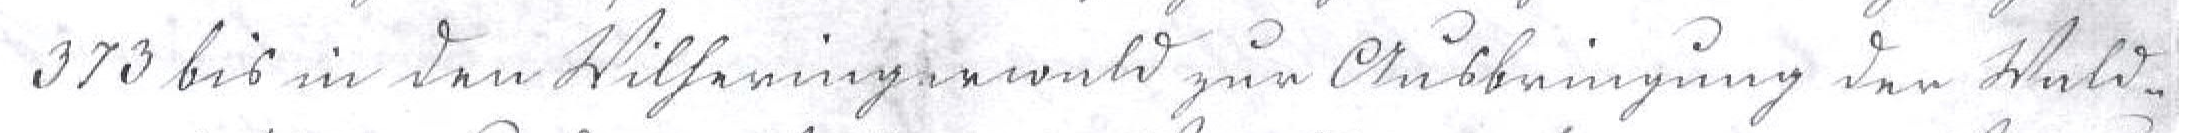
373 bis in den Wilheringerwald zur Ausbringung der Wald¬
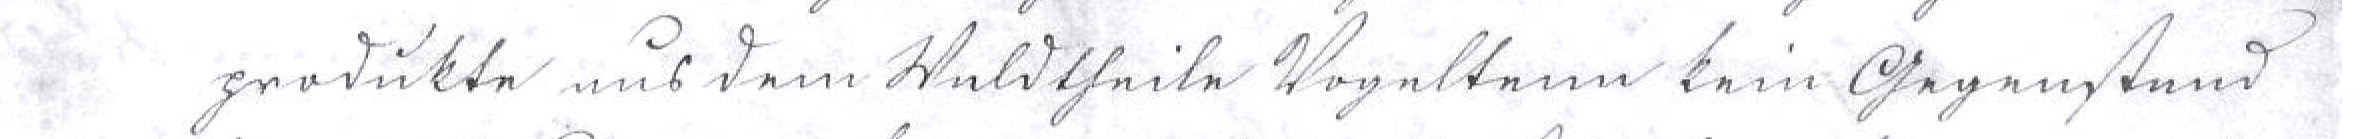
produkte aus dem Waldtheile Vogeltenn kein Gegenstand
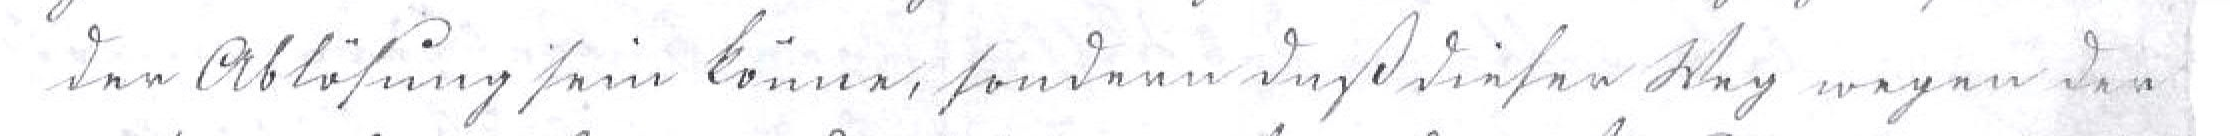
der Ablösung sein könne, sondern daß dieser Weg wegen der
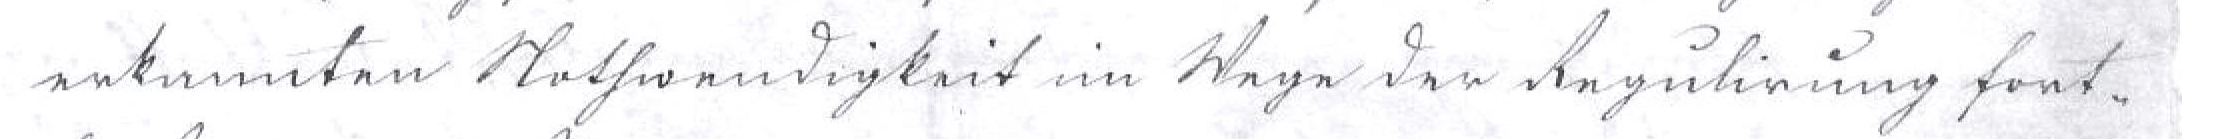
erkannten Notwendigkeit im Wege der Regulirung fort¬
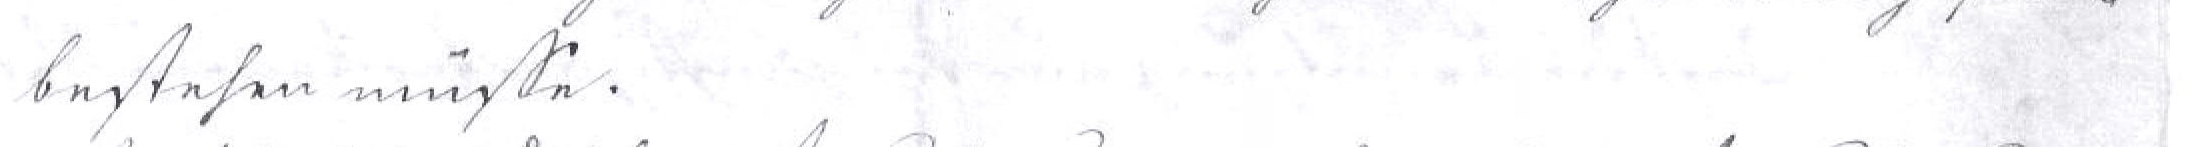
bestehen müsse.
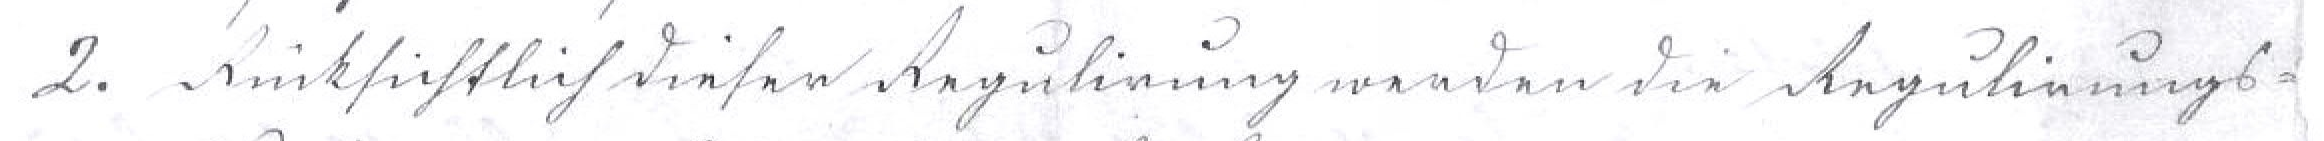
2. Rücksichtlich dieser Regulirung werden die Regulirungs¬
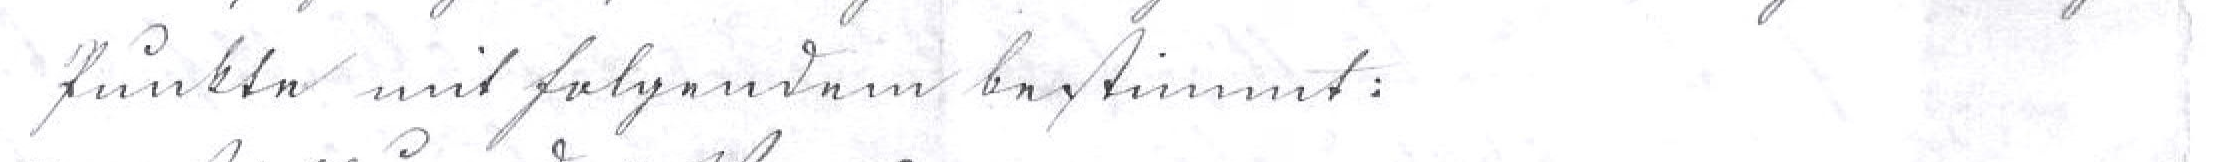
Punkte mit folgendem bestimmt:
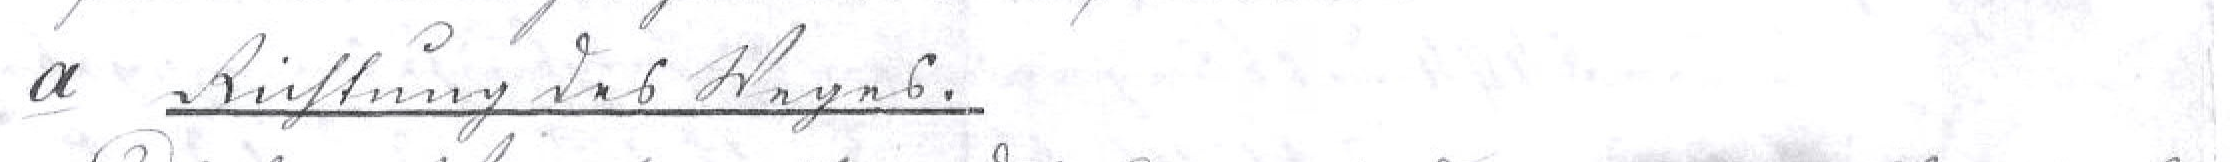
a Richtung des Weges.
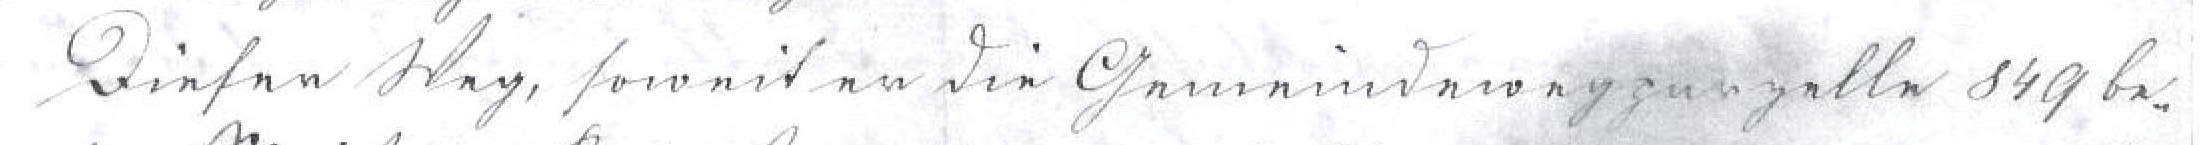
Dieser Weg, soweit er die Gemeindewegparzelle 849 be¬
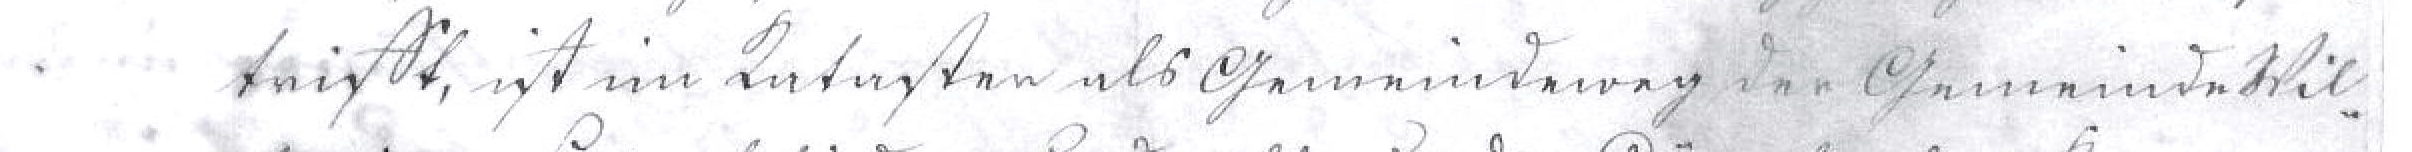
trifft, ist im Kataster als Gemeindeweg der Gemeinde Wil¬
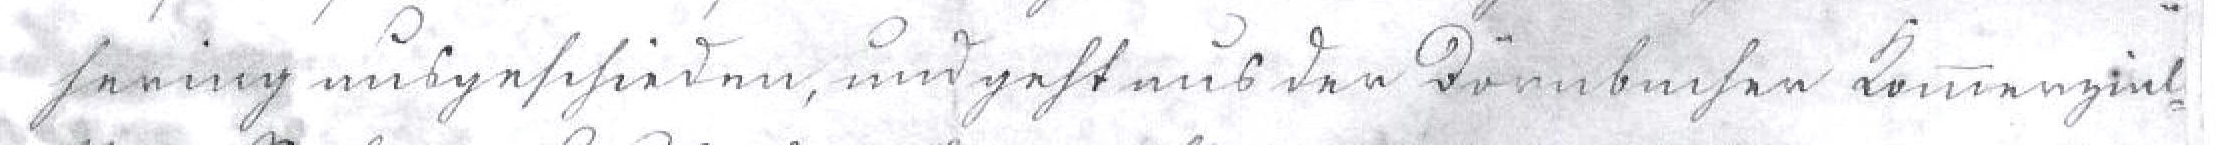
hering ausgeschieden, und geht aus der Dörnbacher Kommerzial-
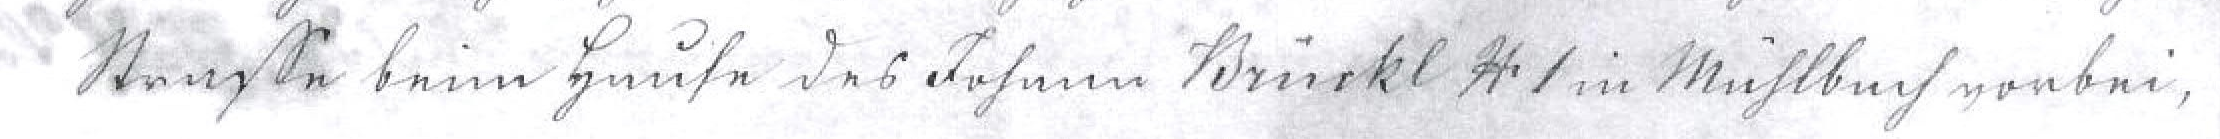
Strasse beim Hause des Johann Brückl № 1 in Mühlbach vorbei,
